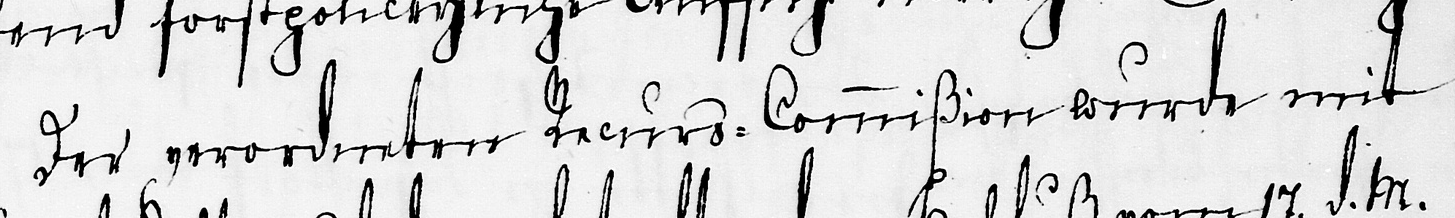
Der verordneten Recurs-Commißion wurde mit
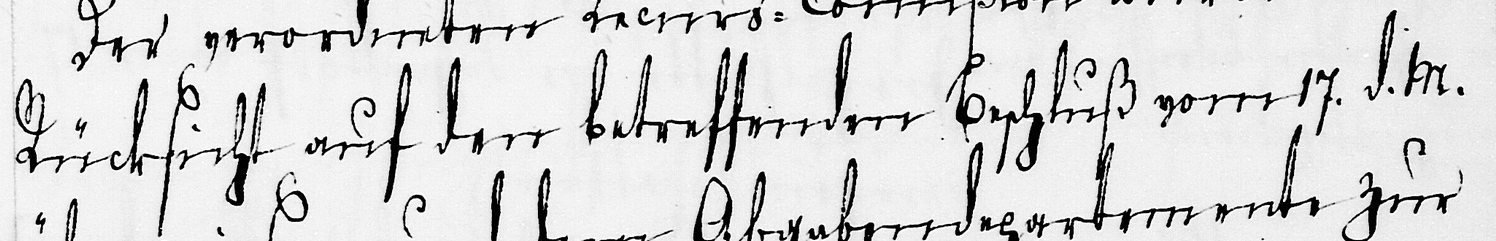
Rücksicht auf den betreffenden Beschluß vom 17. d. M.
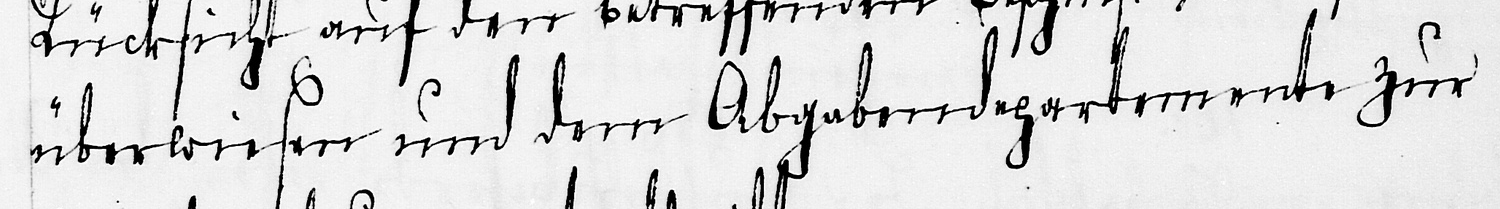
überwiesen und dem Abgabendepartemente zur
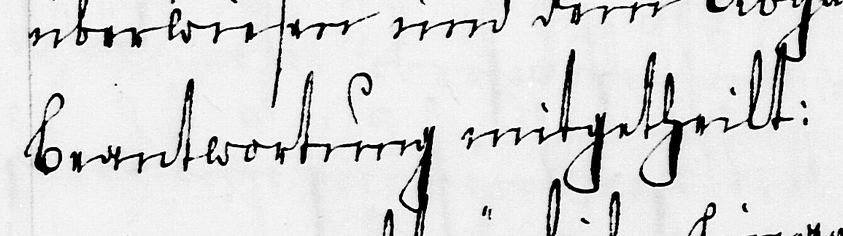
Beantwortung mitgetheilt:
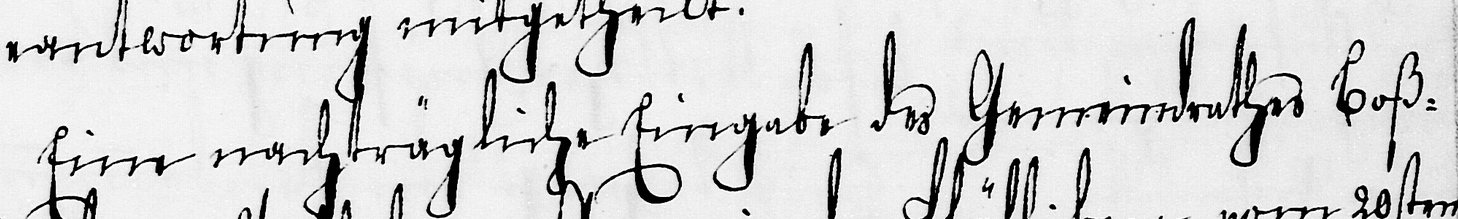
Eine nachträgliche Eingabe des Gemeindrathes Boß¬
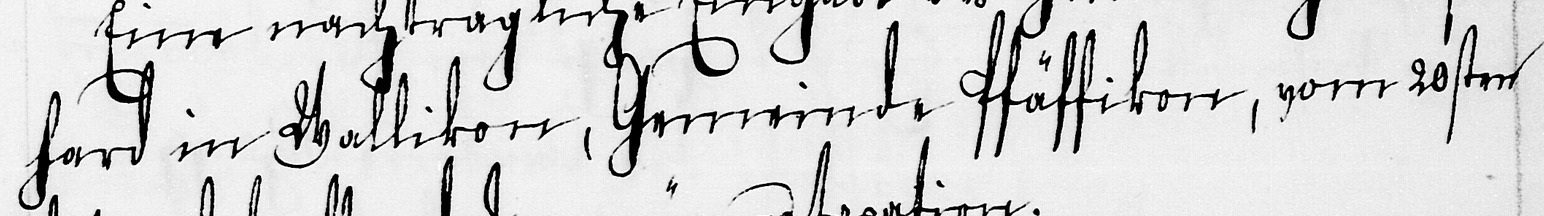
hard in Wallikon, Gemeinde Pfäffikon, vom 20sten
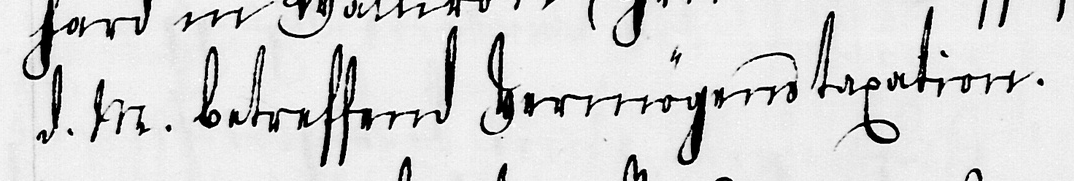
d. M. betreffend Vermögenstaxation.
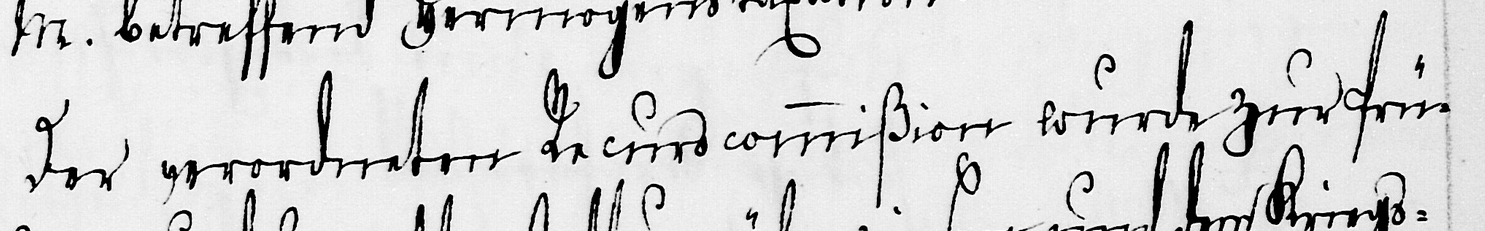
Der verordneten Recurscommißion wurde zur Prü¬
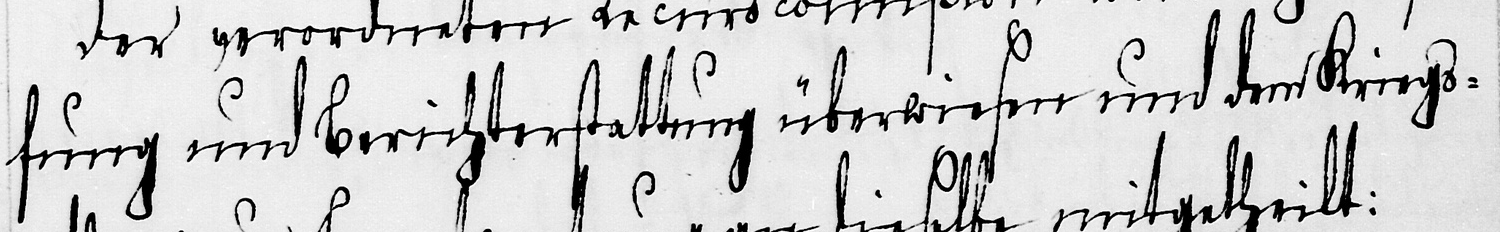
fung und Berichterstattung überwiesen und dem Kriegs¬
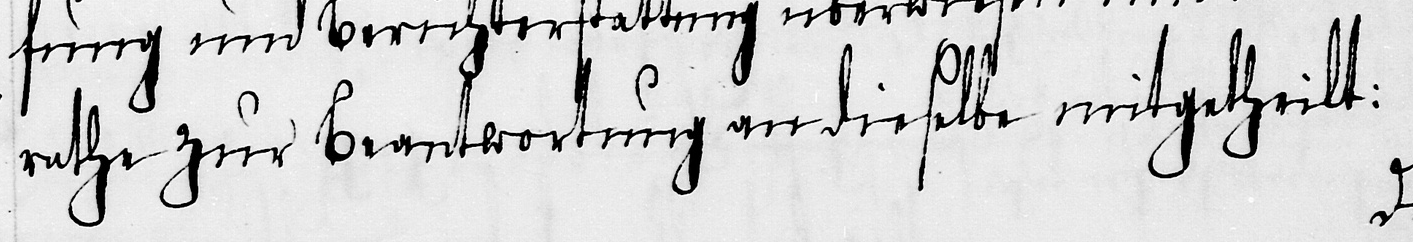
rathe zur Beantwortung an dieselbe mitgetheilt:
